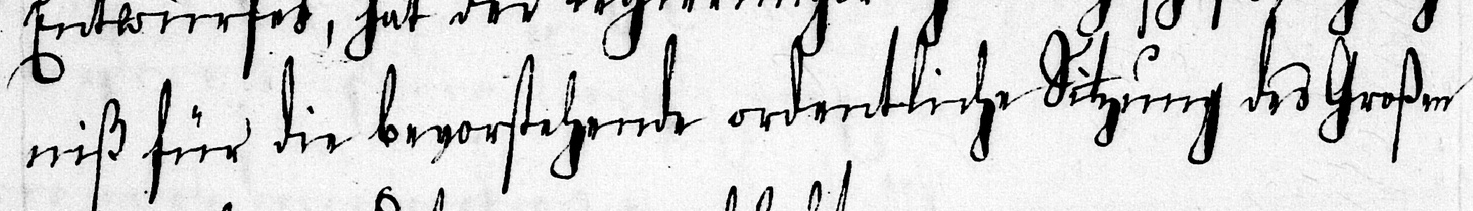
niß für die bevorstehende ordentliche Sitzung des Großen
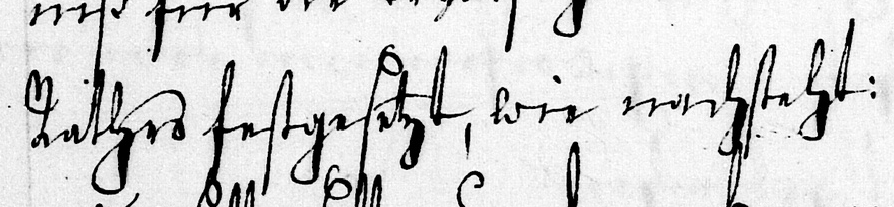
Rathes festgesetzt, wie nachsteht:
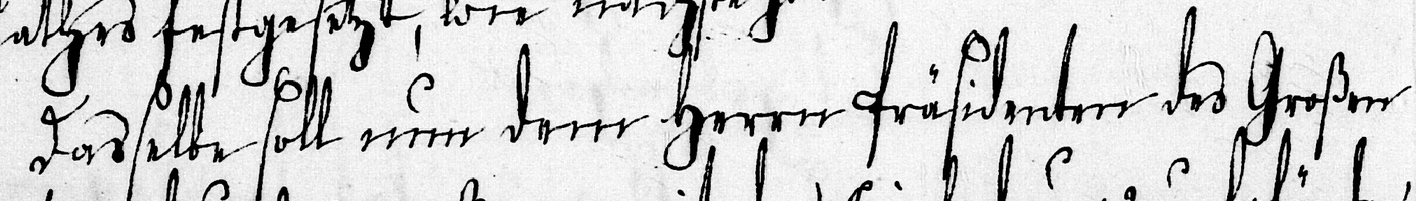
Dasselbe soll nun dem Herrn Präsidenten des Großen
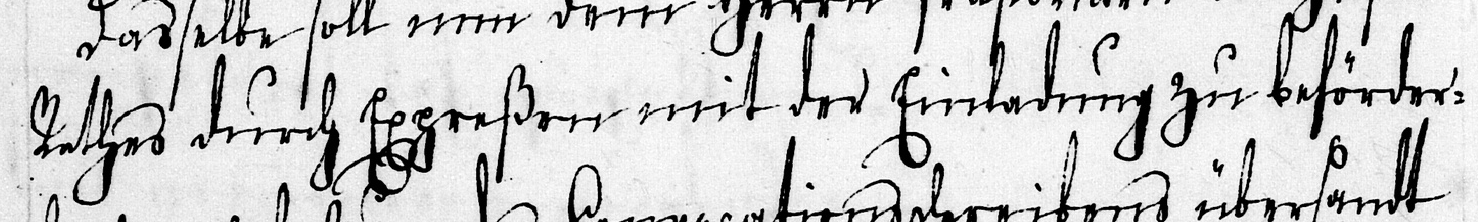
Rathes durch Expreßen mit der Einladung zu beförder¬
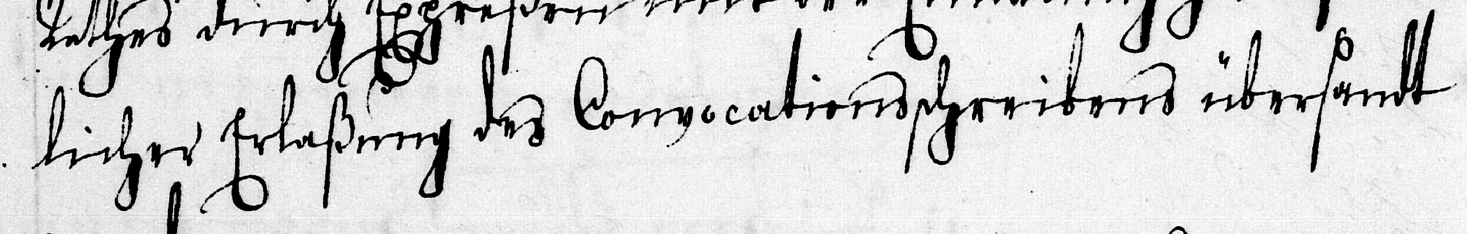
licher Erlaßung des Convocationsschreibens übersandt
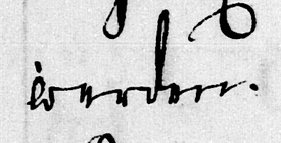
werden.
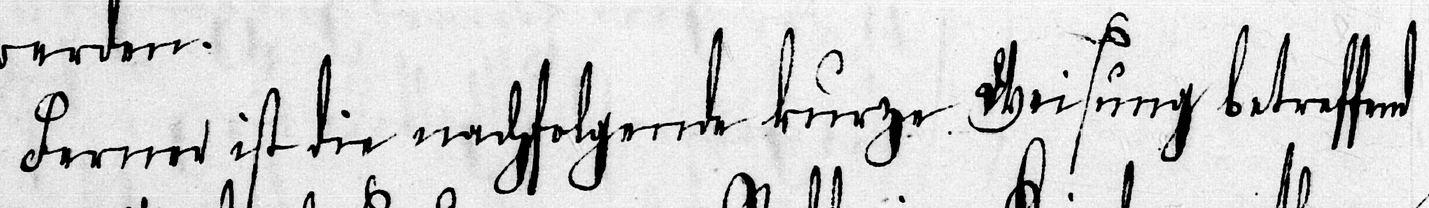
Ferner ist die nachfolgende kurze Weisung betreff¬
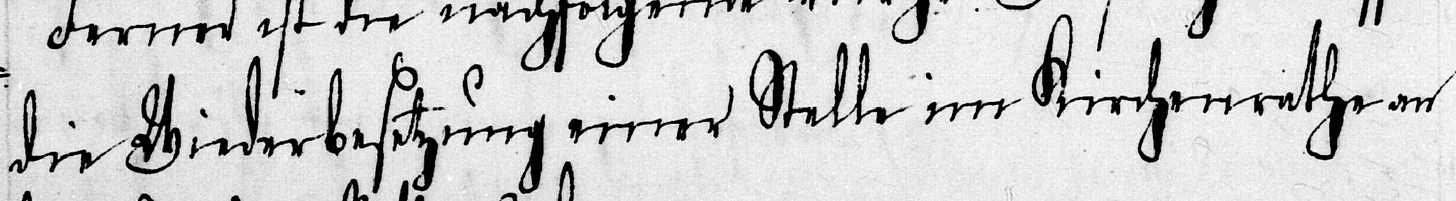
die Wiederbesetzung einer Stelle im Kirchenrathe an
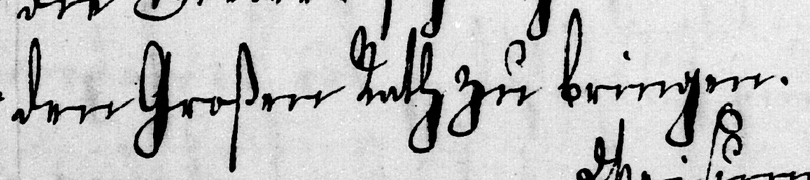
den Großen Rath zu bringen.
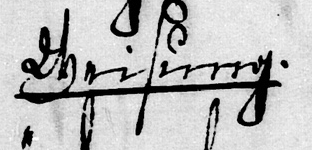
Weisung.
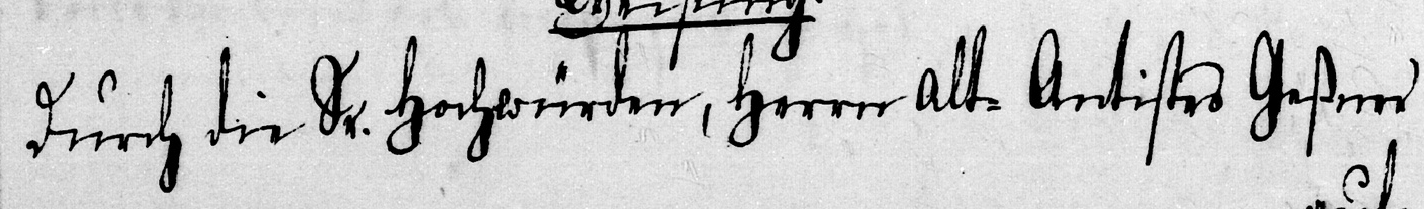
Durch die Sr. Hochwürden, Herrn Alt-Antistes Geßner
